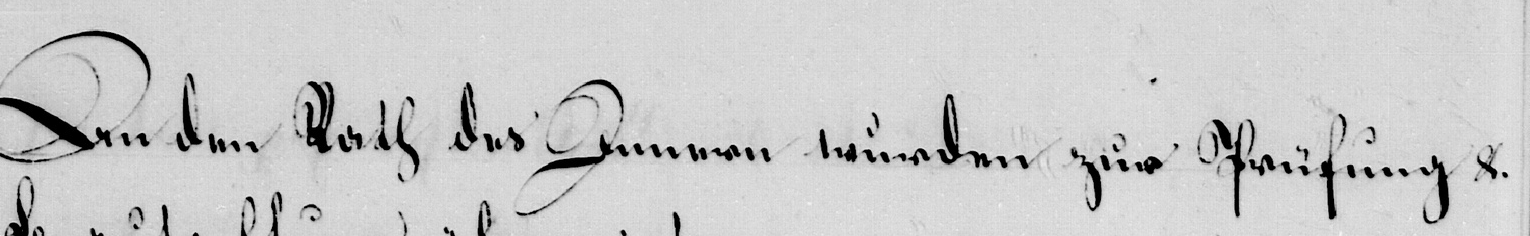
An den Rath des Innern wurden zur Prüfung &
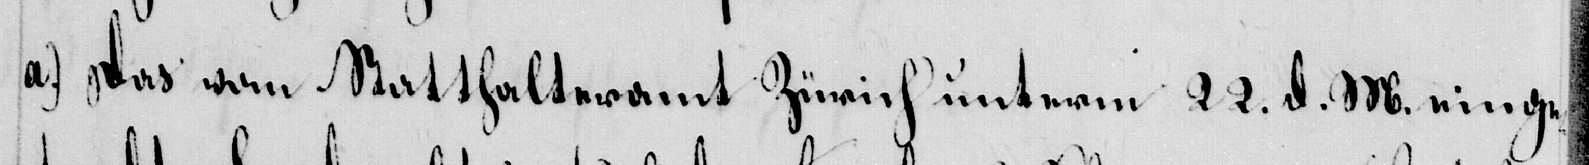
a.) das vom Statthalteramt Zürich unterm 22. d. M. einge¬
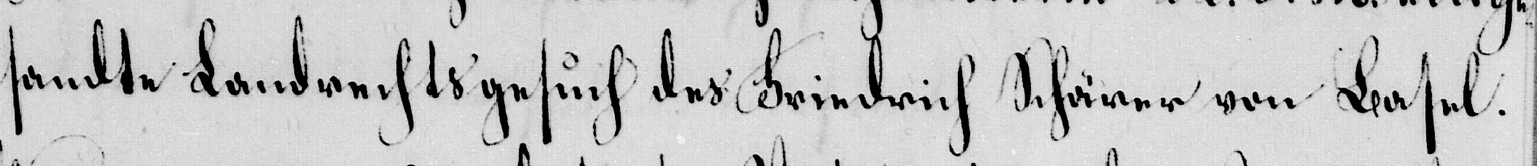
sandte Landrechtsgesuch des Friedrich Schärer von Basel.
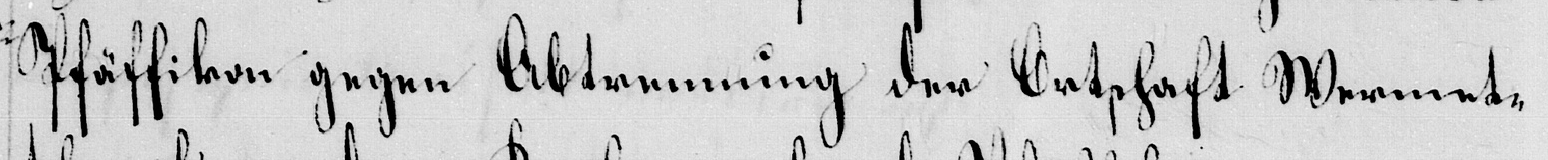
Pfäffikon gegen Abtrennung der Ortschaft Wermet¬
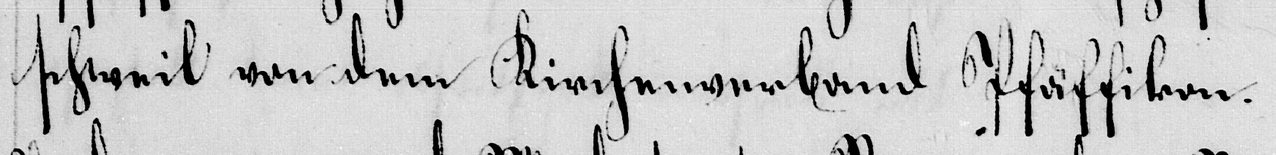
schweil von dem Kirchenverband Pfäffikon.
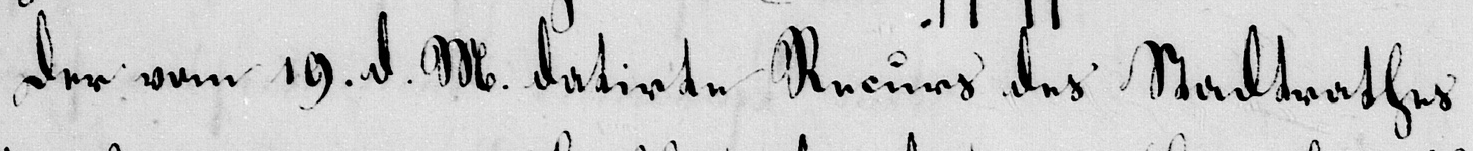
der vom 19. d. M. datirte Recurs des Stadtrathes
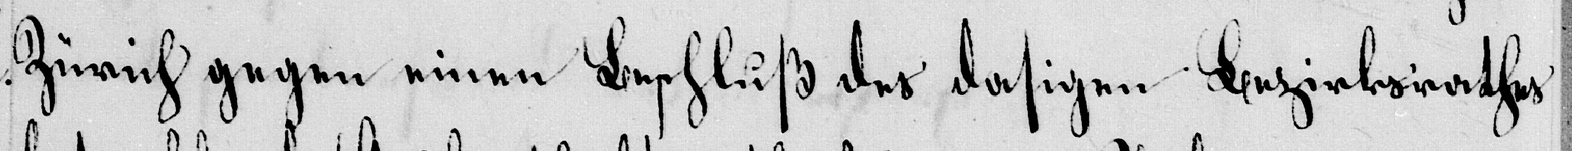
Zürich gegen einen Beschluß des dasigen Bezirksrathes
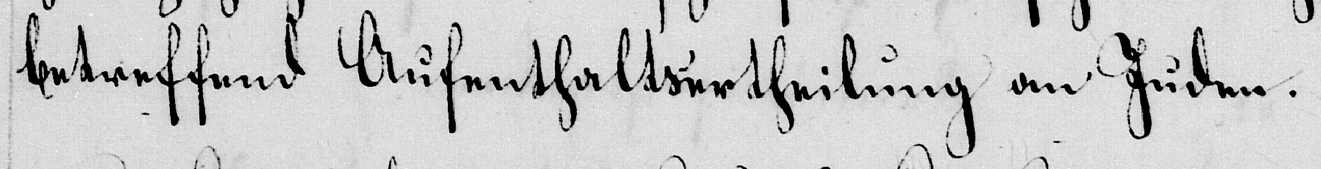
betreffend Aufenthaltsertheilung an Juden.
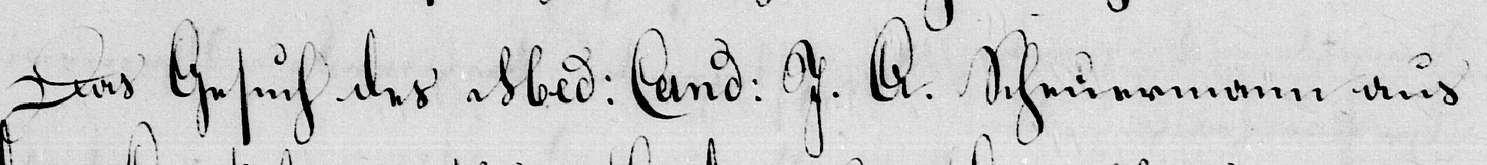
Das Gesuch des Med: Cand: J. A. Schnurrmann aus
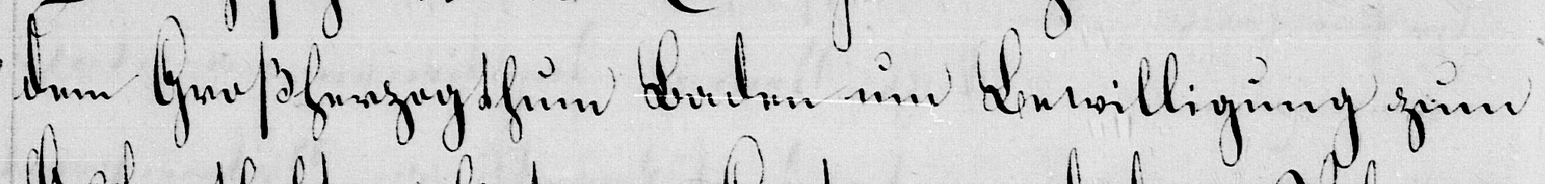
dem Großherzogthum Baden um Bewilligung zum
